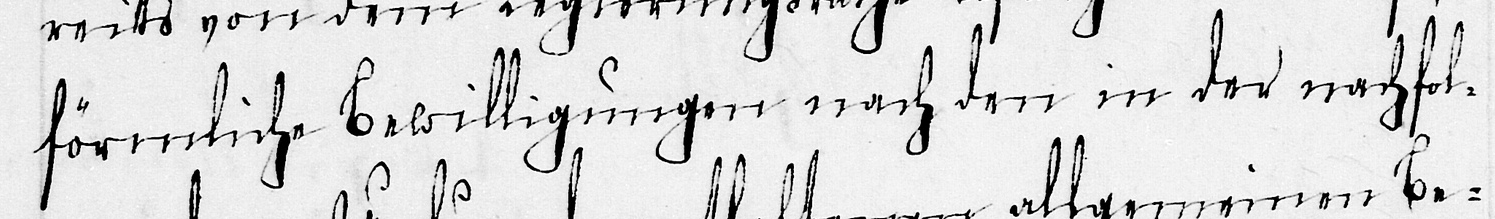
förmliche Bewilligungen nach den in der nachfol¬
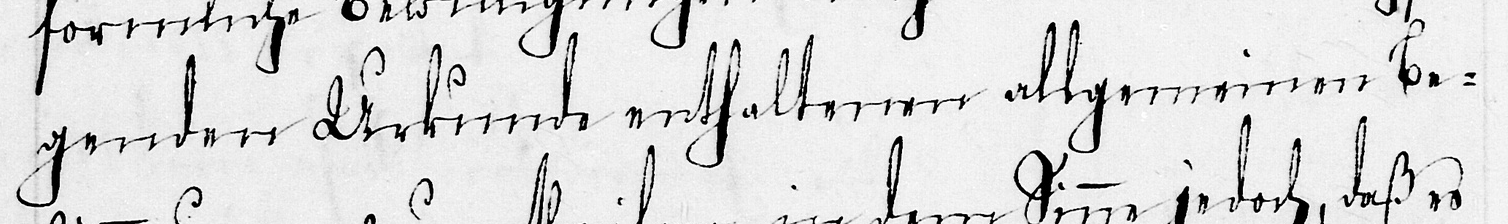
genden Urkunde enthaltenen allgemeinen Be¬
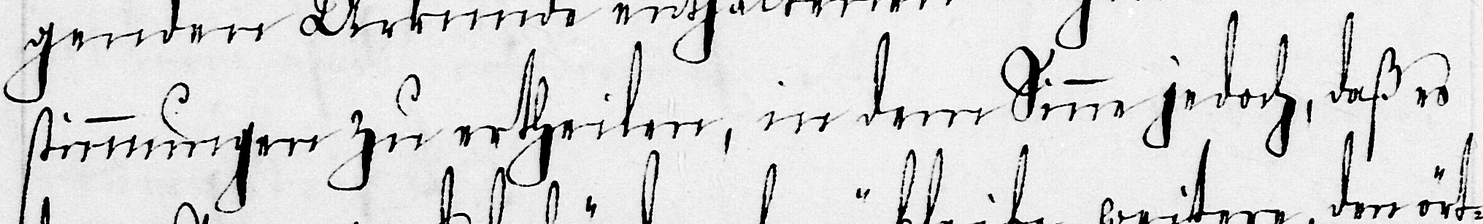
stimmungen zu ertheilen, in dem Sinne jedoch, daß es
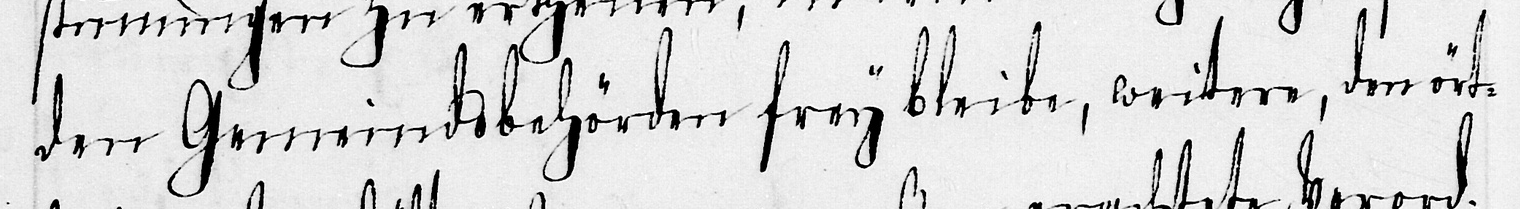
den Gemeindsbehörden frey bleibe, weitere, den ör¬
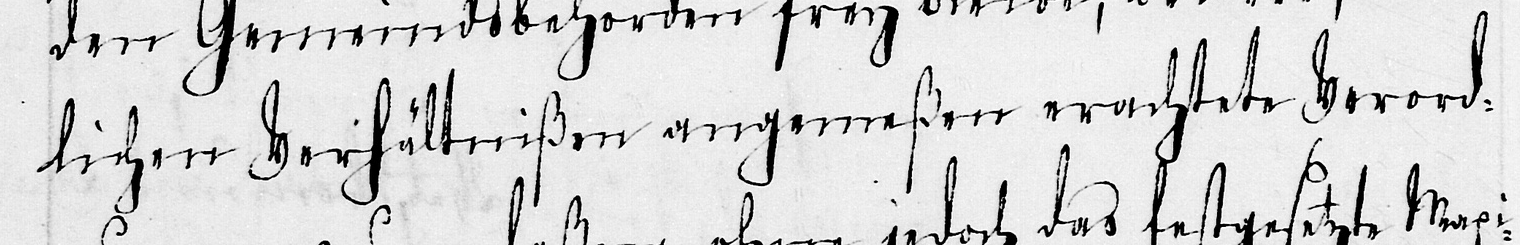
tlichen Verhältnißen angemeßen erachtete Verord¬
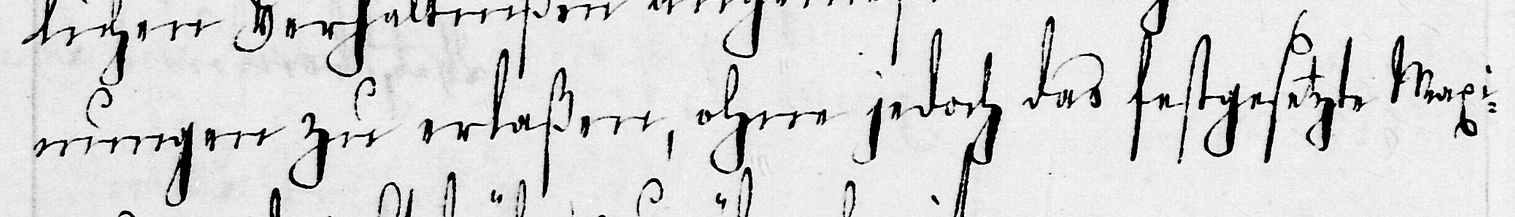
nungen zu erlaßen, ohne jedoch das festgesetzte Max¬
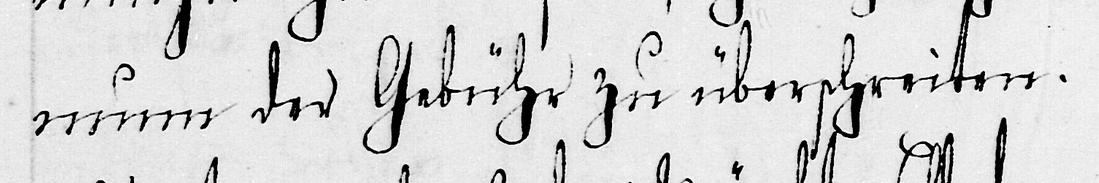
imum der Gebühr zu überschreiten.
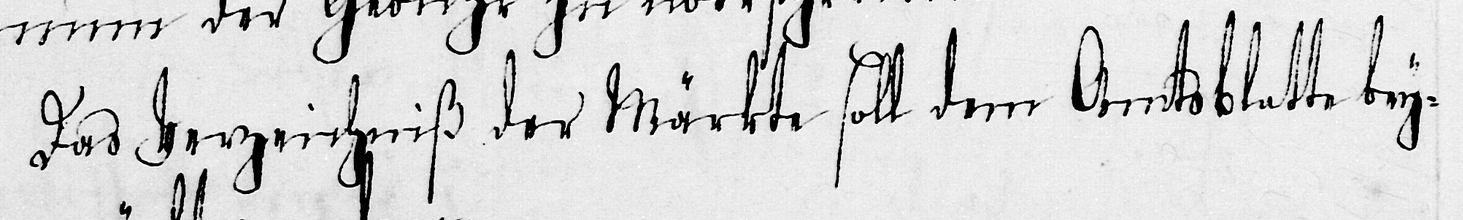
Das Verzeichniß der Märkte soll dem Amtsblatte be¬
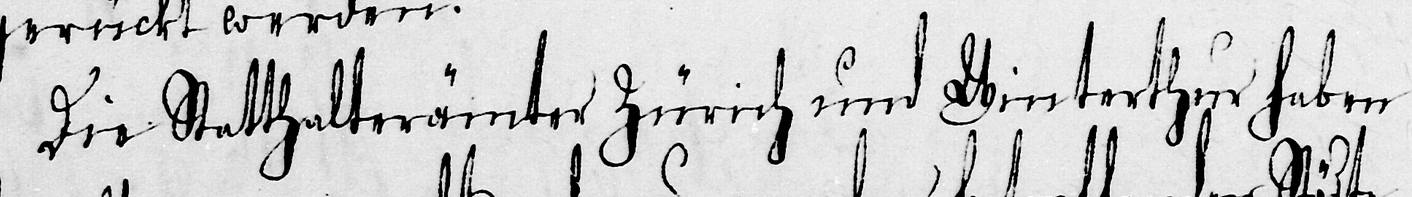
Die Statthalterämter Zürich und Winterthur haben
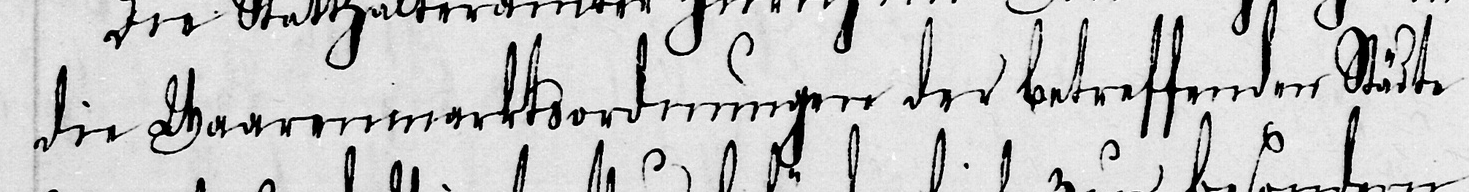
die Waarenmarktsordnungen der betreffenden Städte
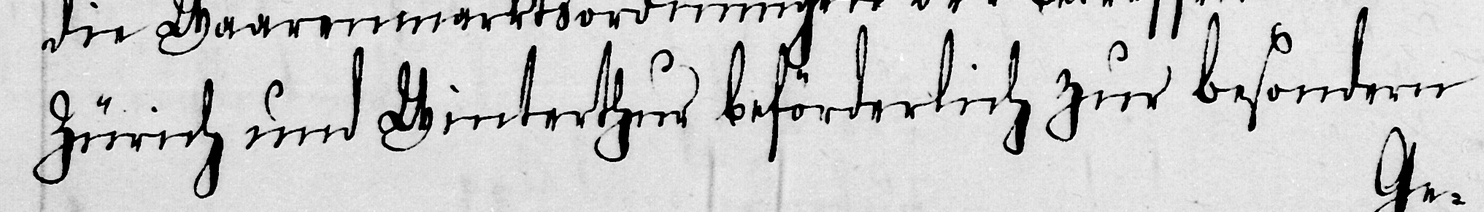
Zürich und Winterthur beförderlich zur besondern
